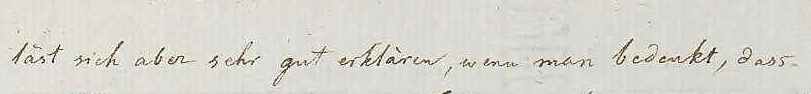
läst sich aber sehr gut erklären, wenn man bedenkt, dass
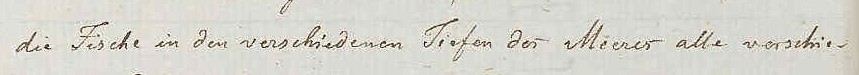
die Fische in den verschiedenen Tiefen des Meeres alle verschie-
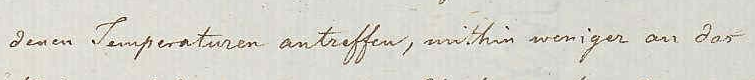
denen Temperaturen antreffen, mithin weniger an das
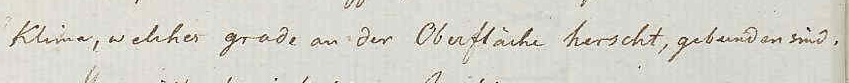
Klima, welches grade an der Oberfläche herscht, gebunden sind.
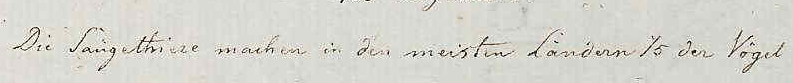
Die Säugethiere machen in den meisten Ländern ⅕ der Vögel
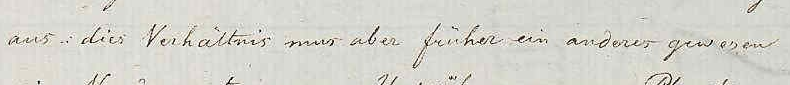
aus: dies Verhältnis muss aber früher ein anderes gewesen
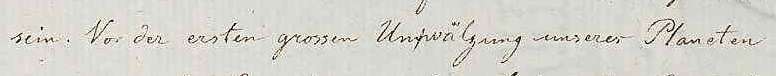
sein. Vor der ersten grossen Unnmwälzung unseres Planeten
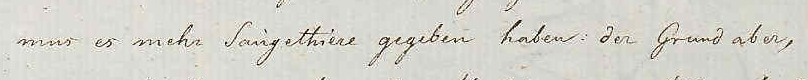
mus es mehr Säugethiere gegeben haben: der Grund aber,
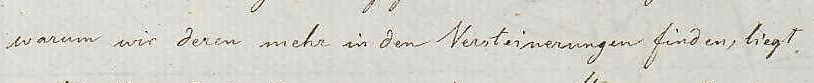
warum wir deren mehr in den Versteinerungen finden, liegt
